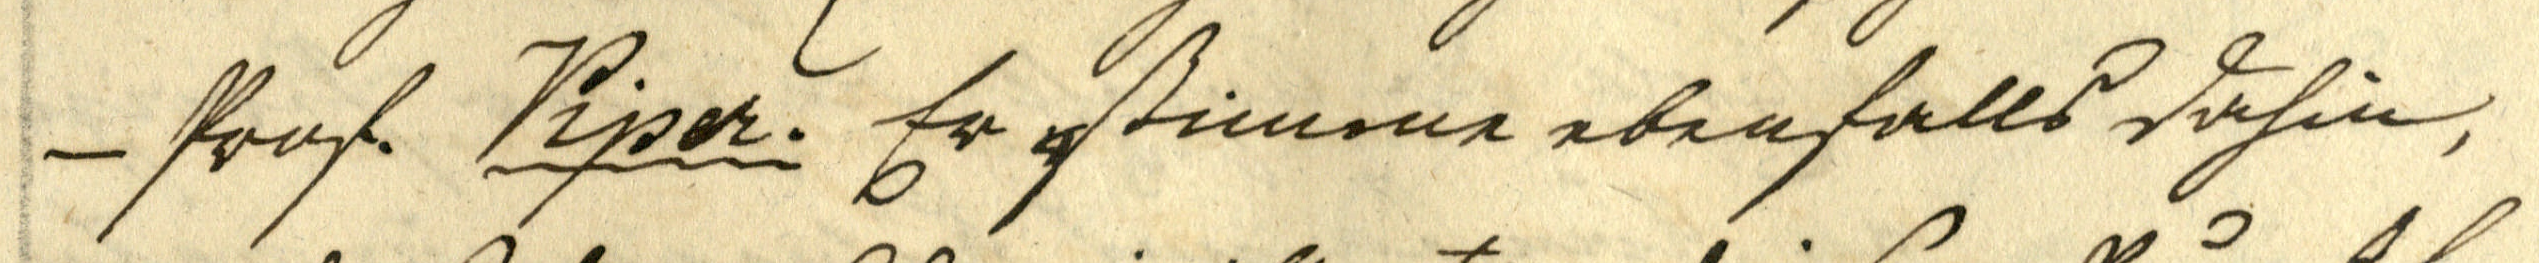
Prof. Piper. Er stimme ebenfalls dahin,
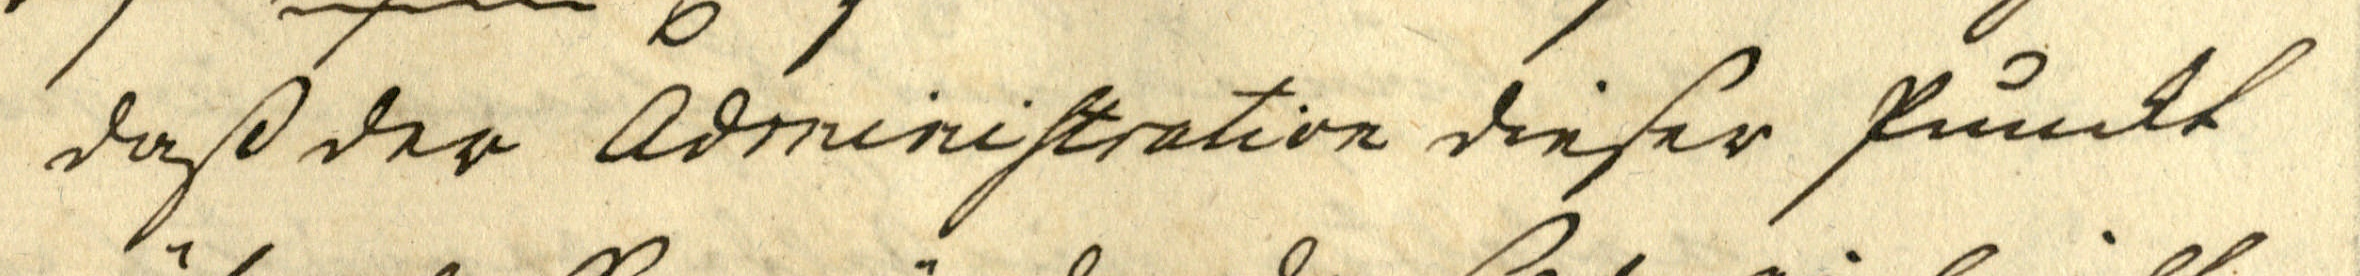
daß der Administration dieser Punckt
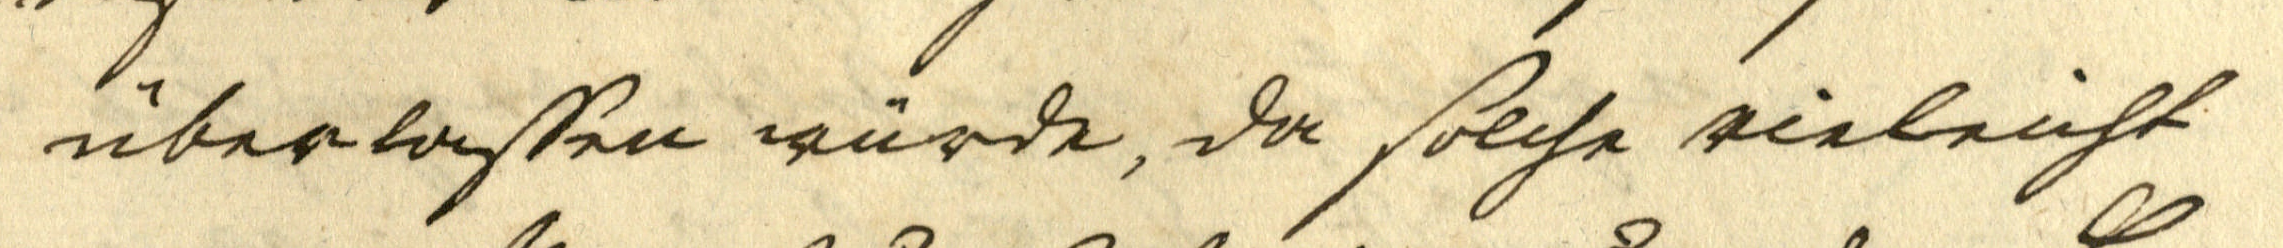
überlassen würde, da solche vieleicht
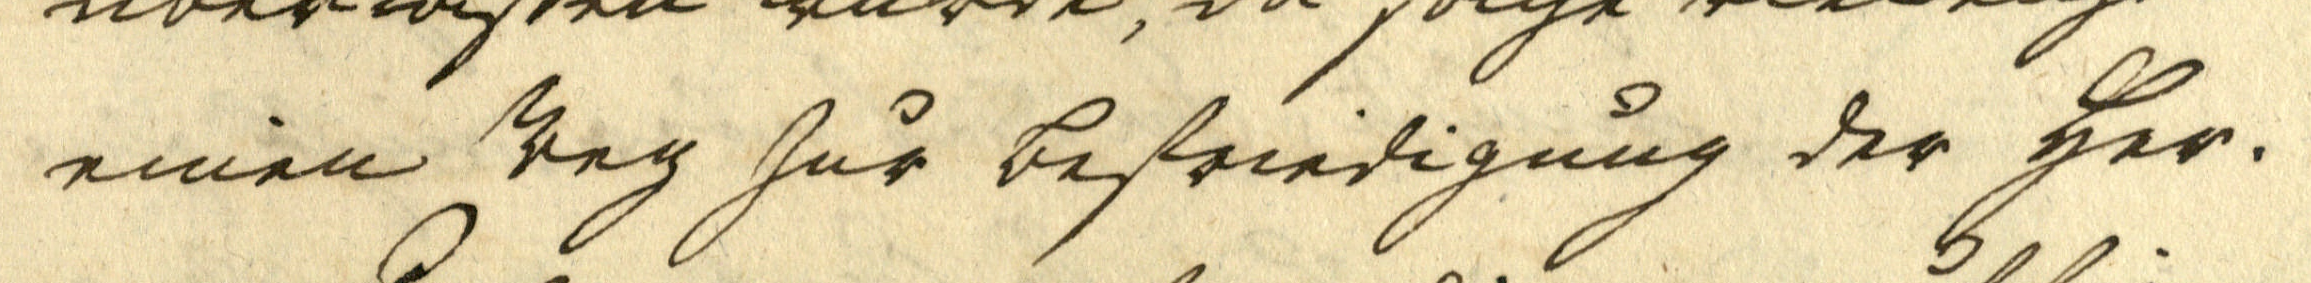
einen Weg zur Befriedigung der Her¬
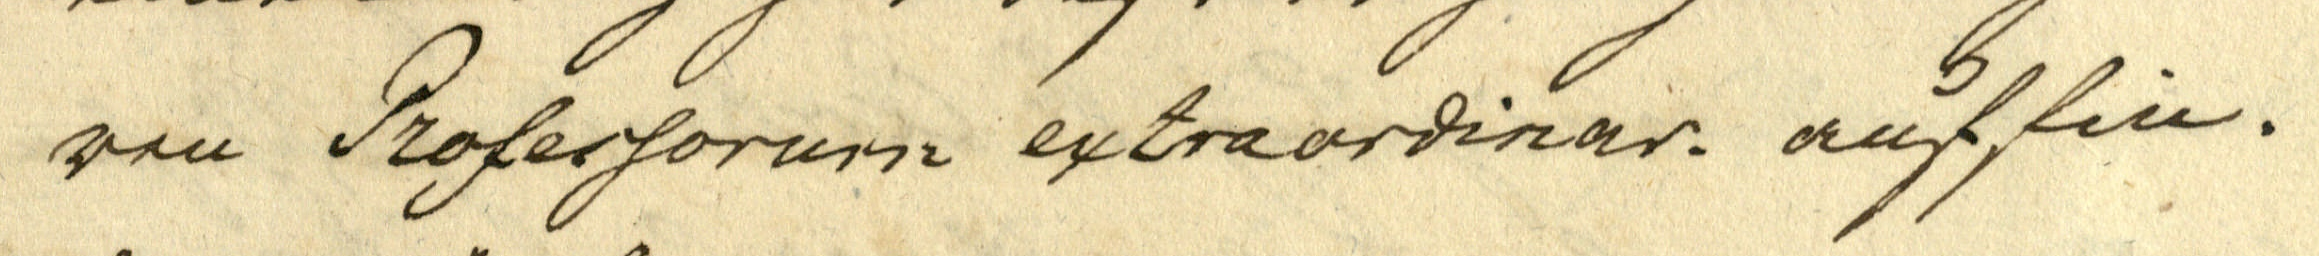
ren Professorum extraordinar. auffin¬
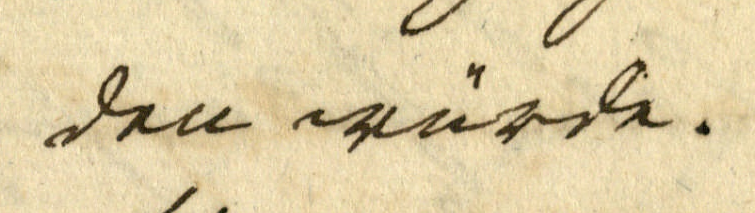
den würde.
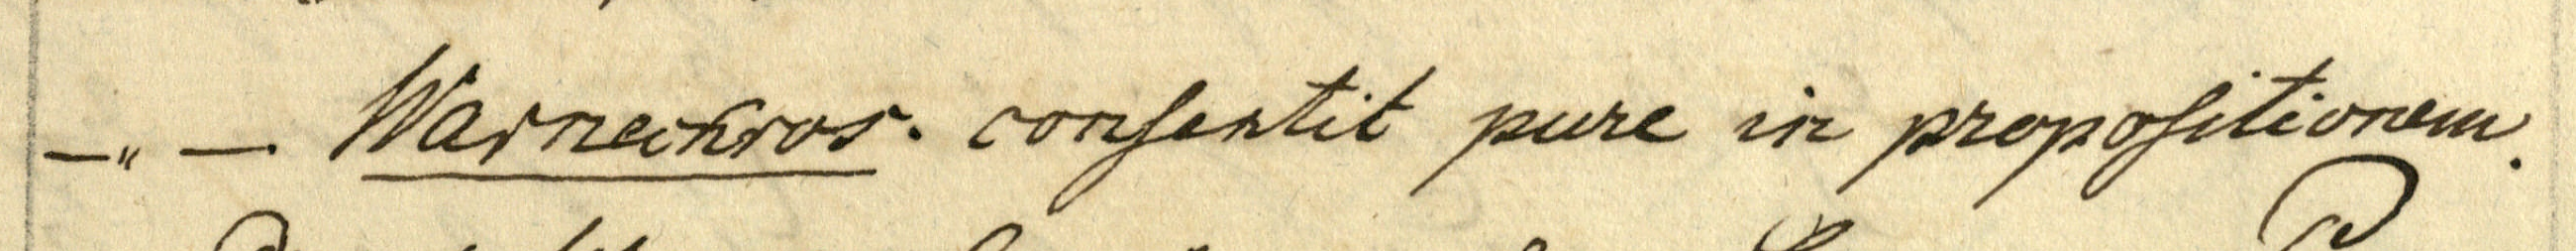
Warneckros. consentit pure in propostionem.
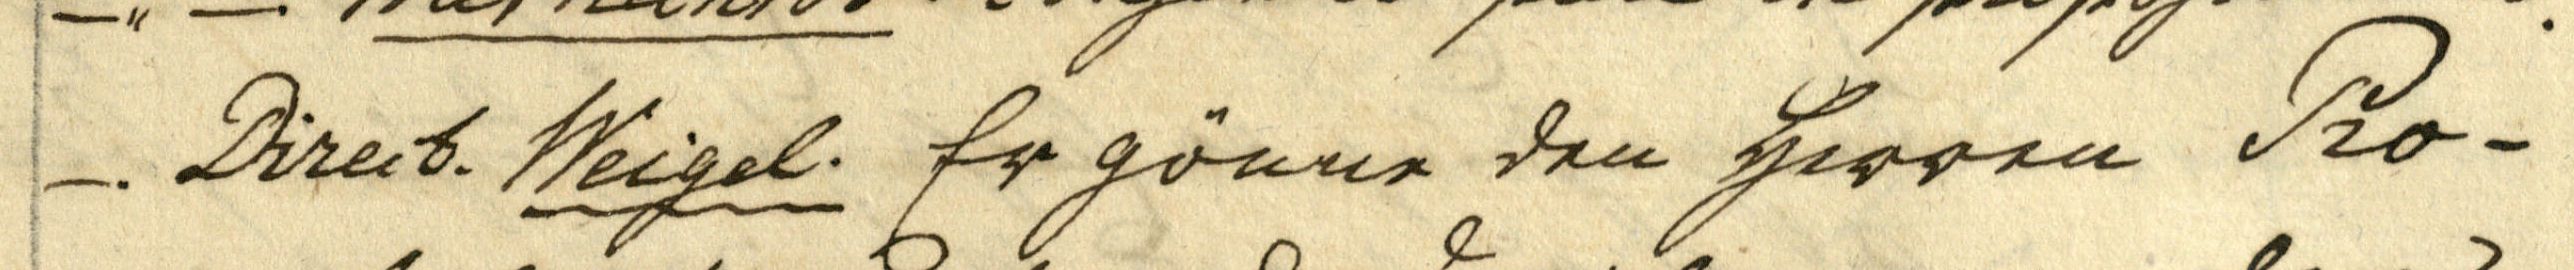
Direct. Weigel. Er gönne den Herren Pro¬
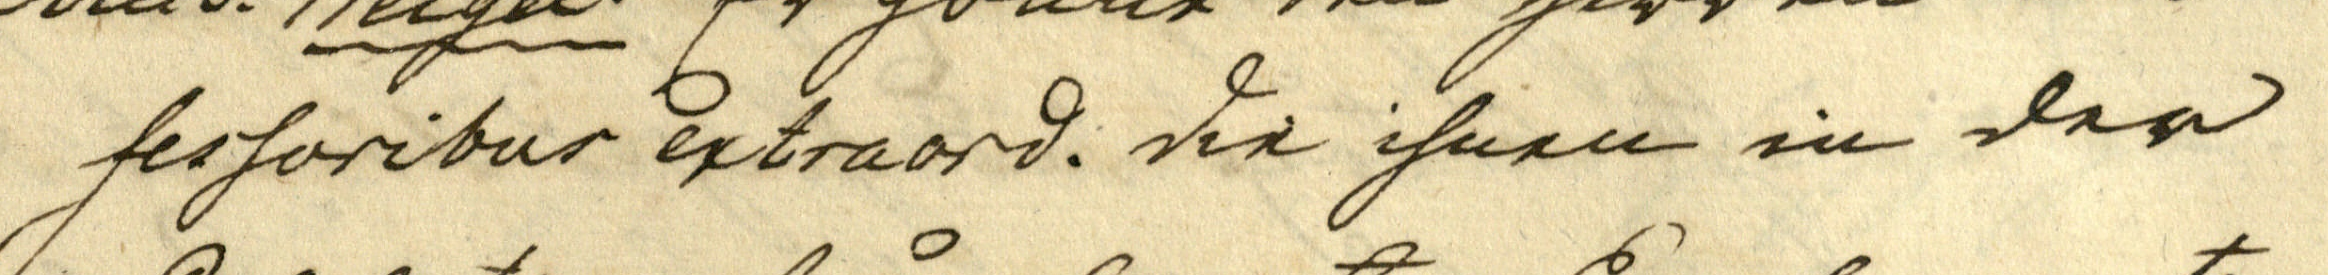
fessoribus extraord. die ihnen in der
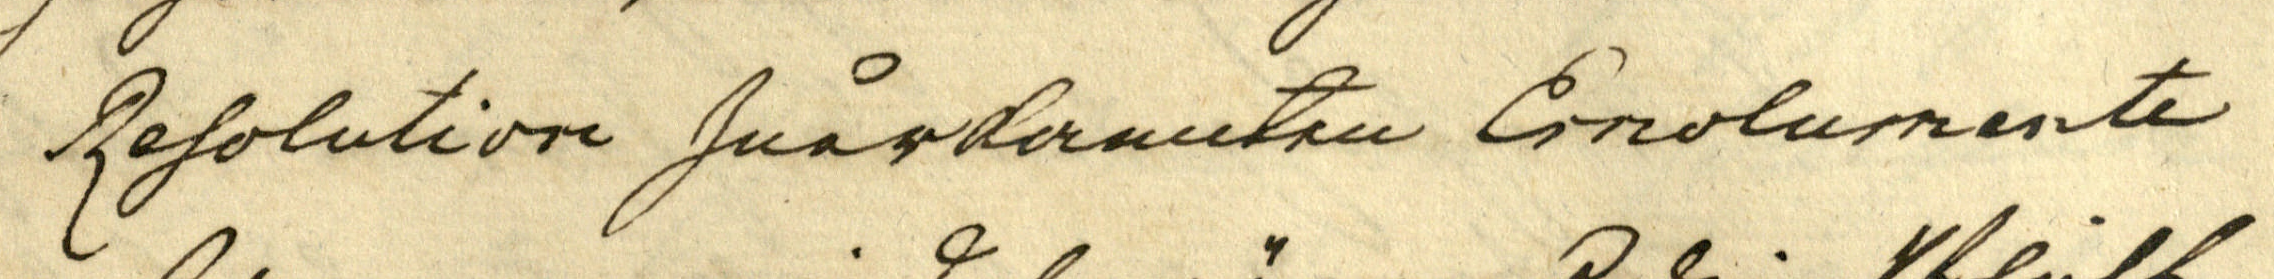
Resolution zuerkannten Emolumente
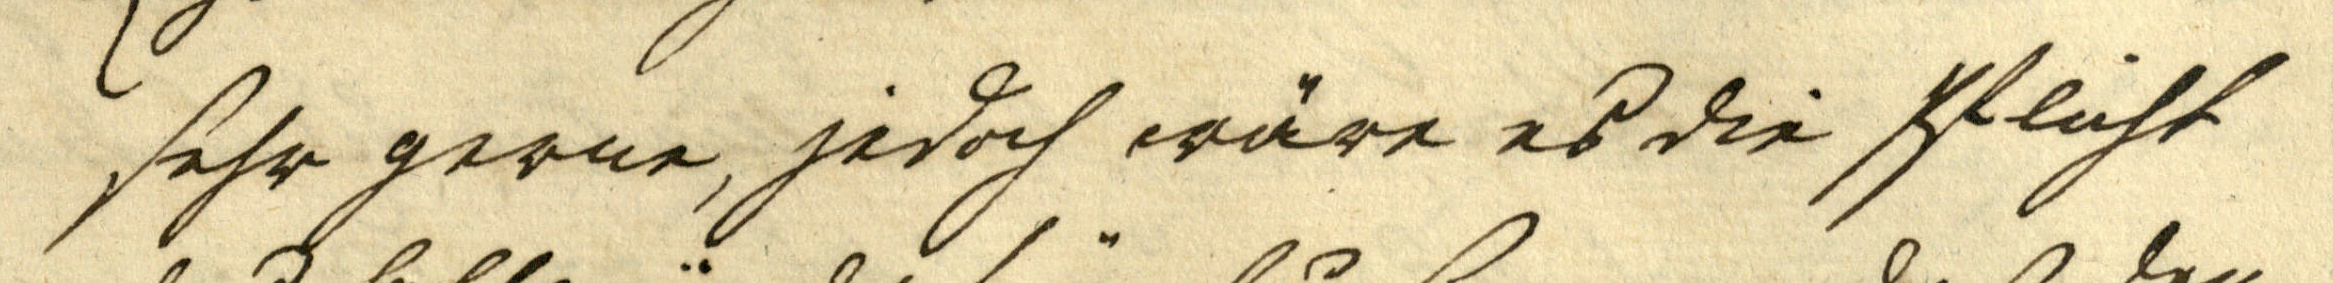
sehr gerne, jedoch wäre es die Pflicht
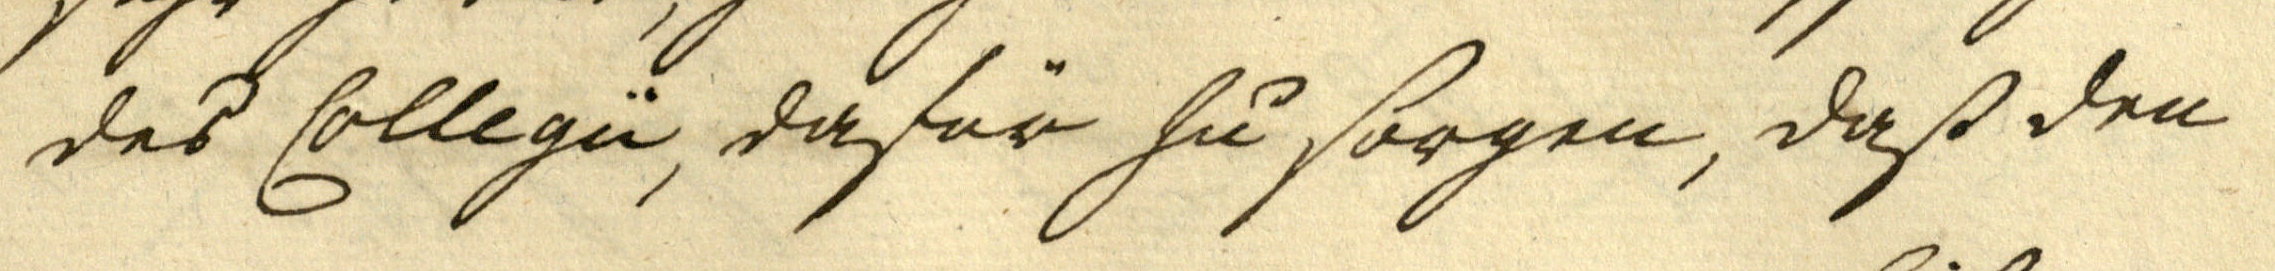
des Collegii, dafür zu sorgen, daß den
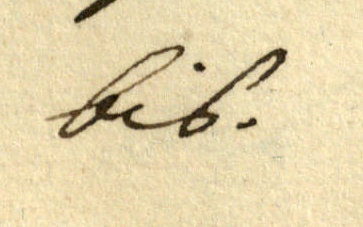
bis-
